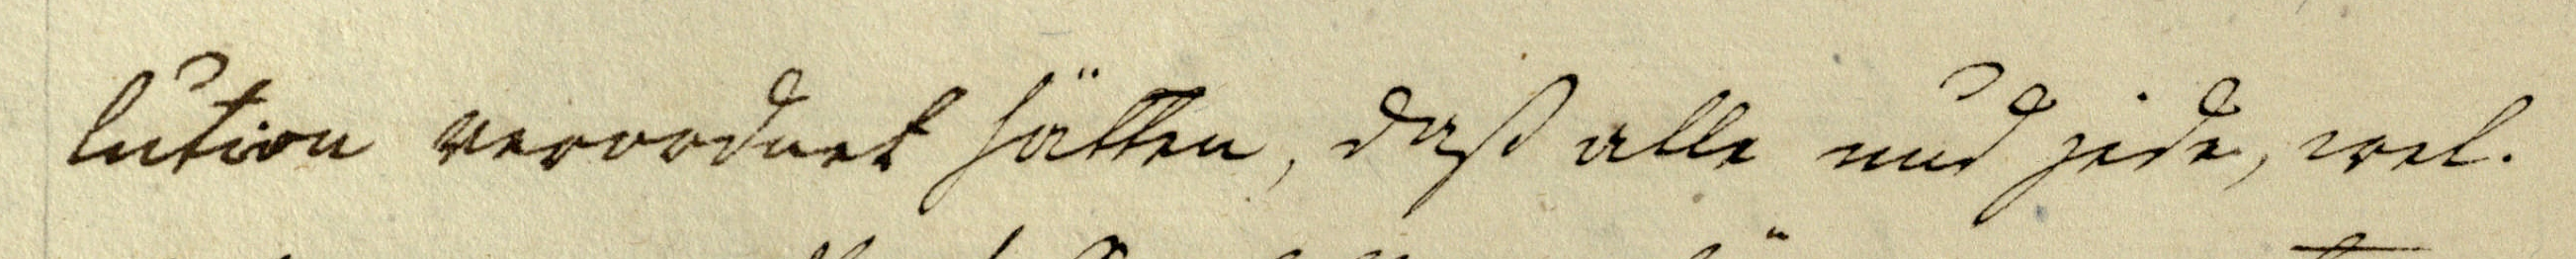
lution verordnet hätten, daß alle und jede, wel¬
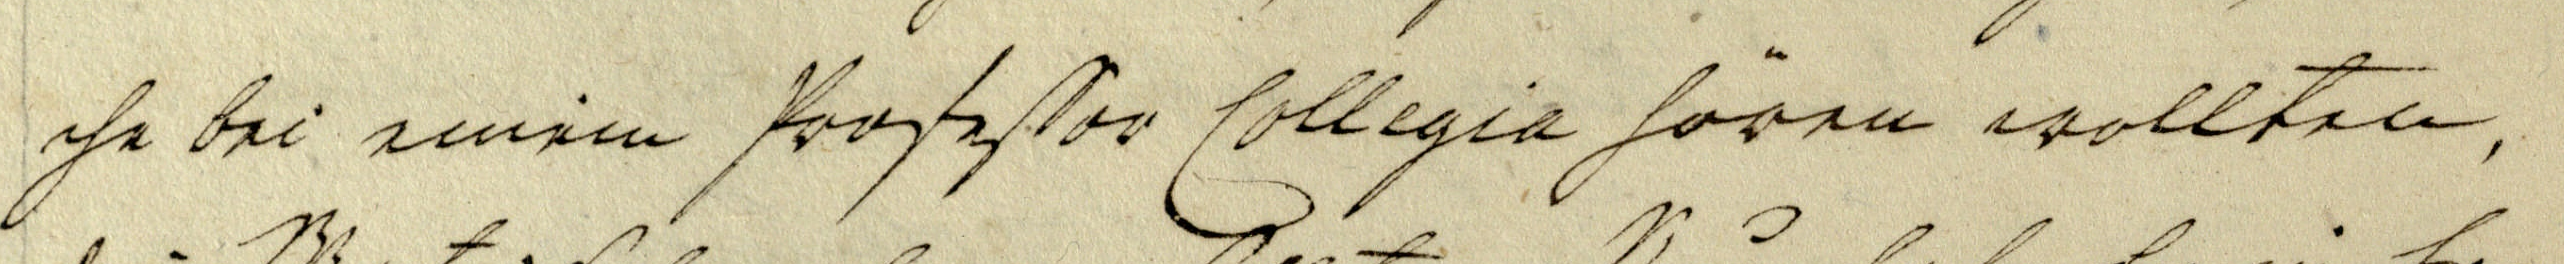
che bei einem Professor Collegia hören wollten,
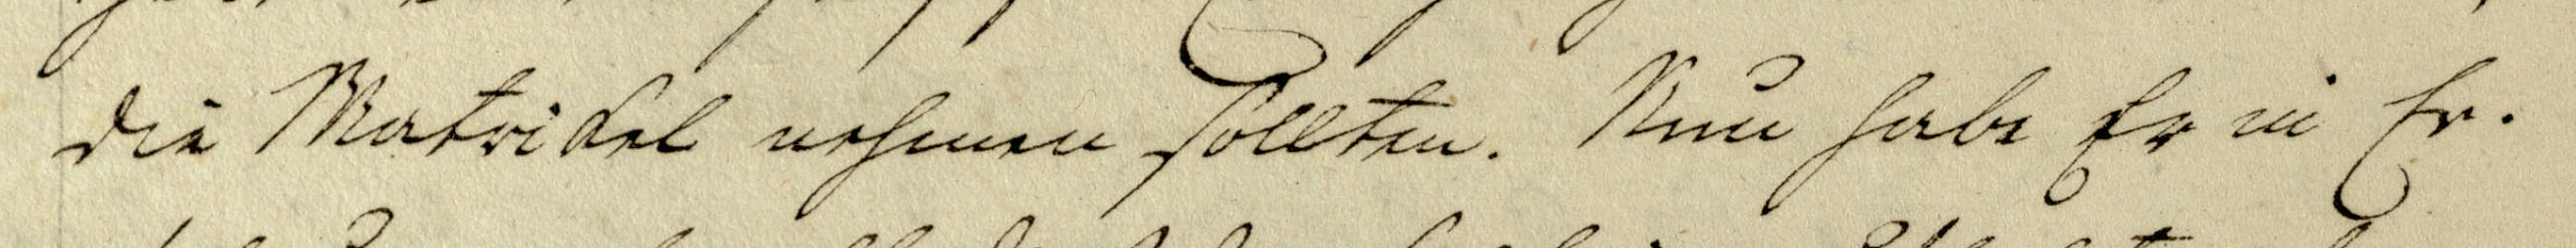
die Matrikel nehmen sollten. um habe Er in Er¬
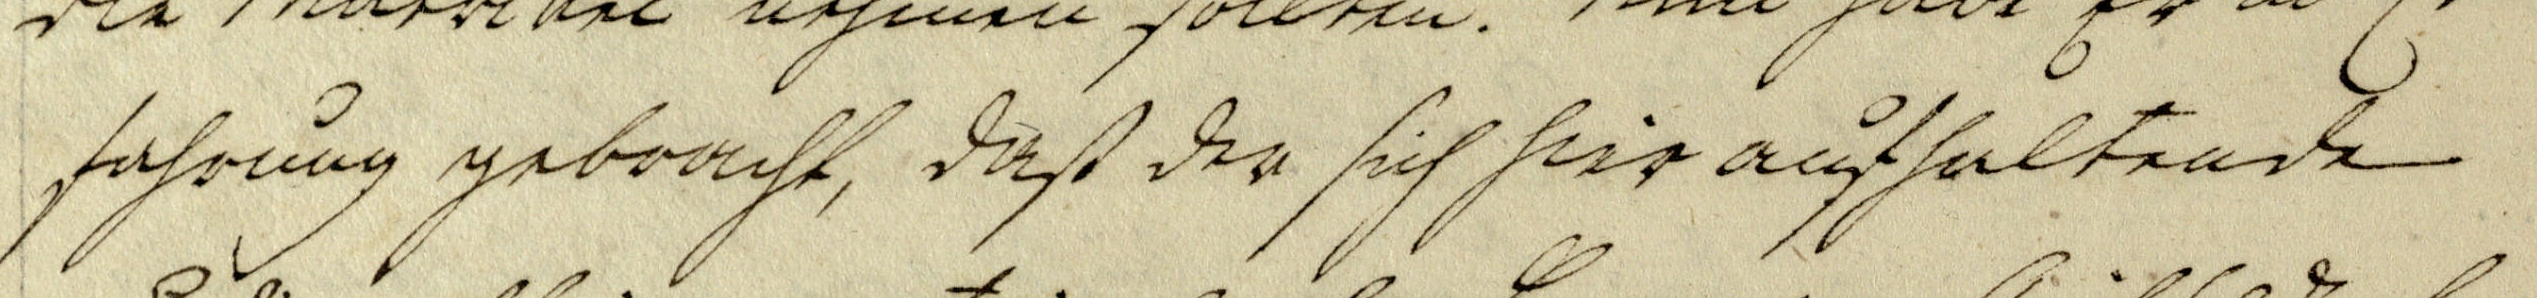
fahrung gebracht, daß der sich hier aufhaltende
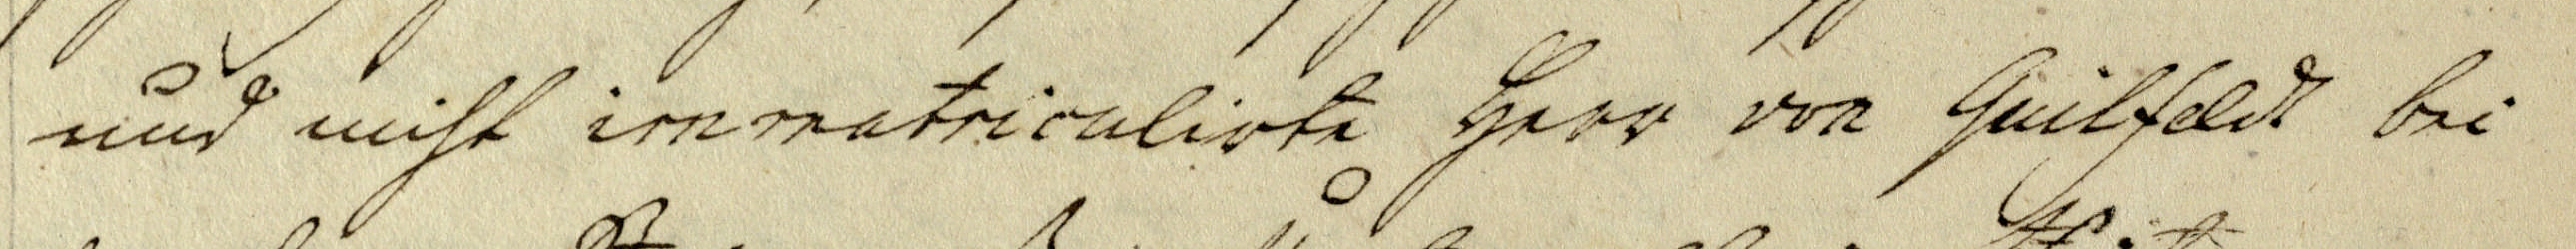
und nicht immatriculirte Herr von Quilfeldt bei
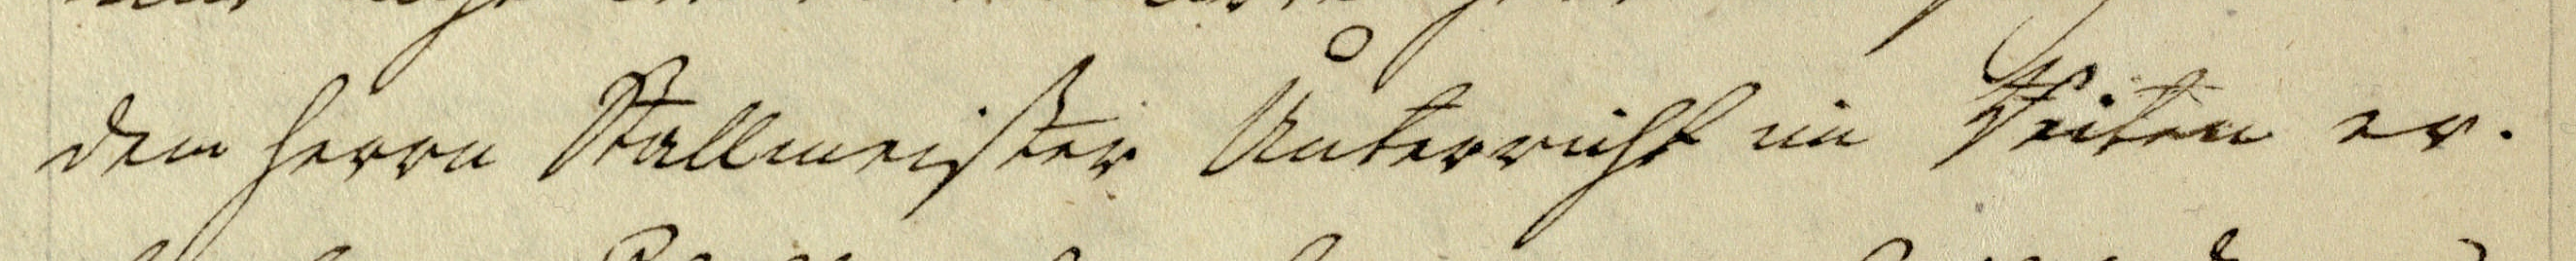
dem Herrn Stallmeister Unterricht im Reiten er¬
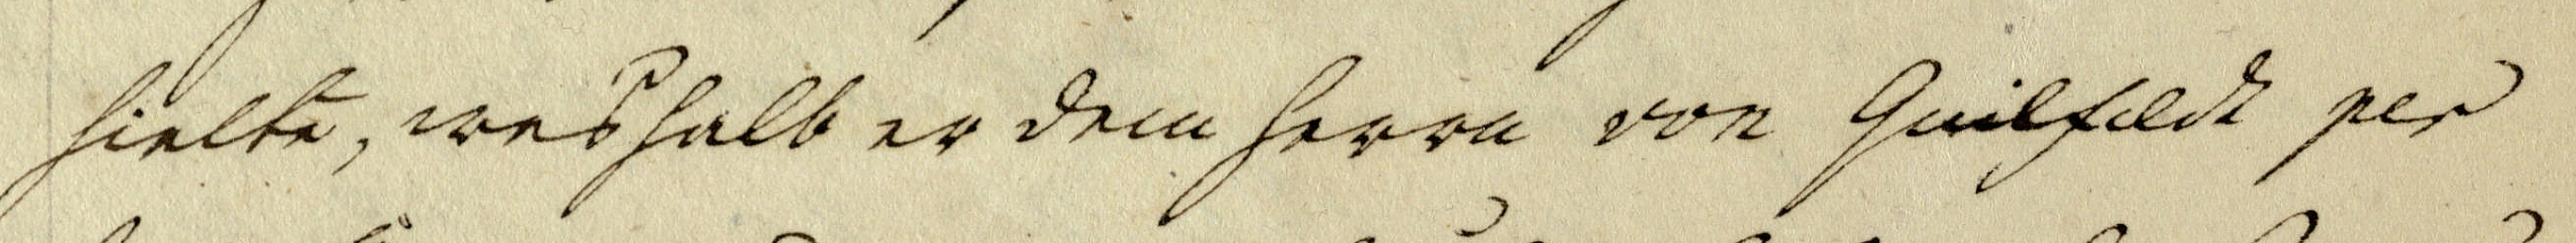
hielte, weshalb er dem Herrn von Quilfeldt per
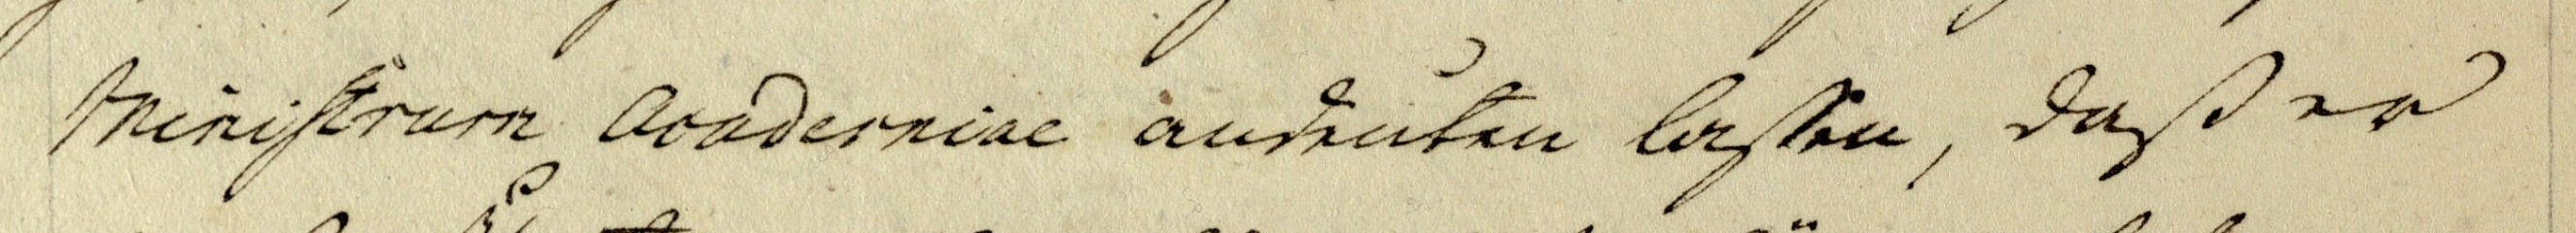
Ministrum Academiae andeuten lassen, daß er
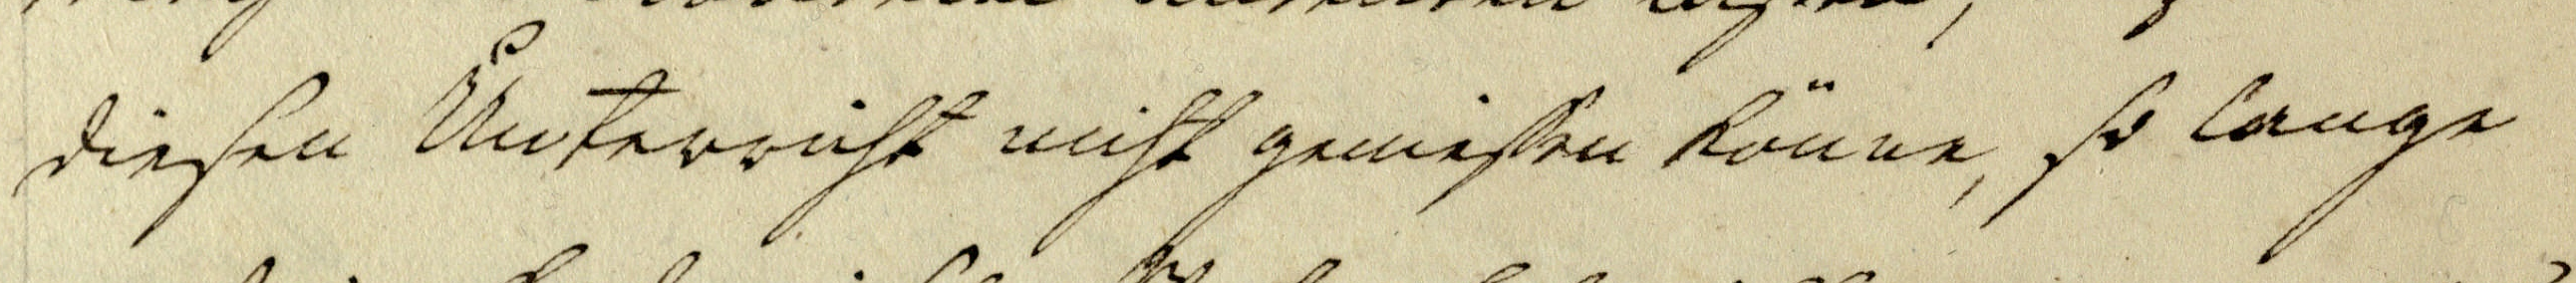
diesen Unterricht nicht geniessen könne, so lange
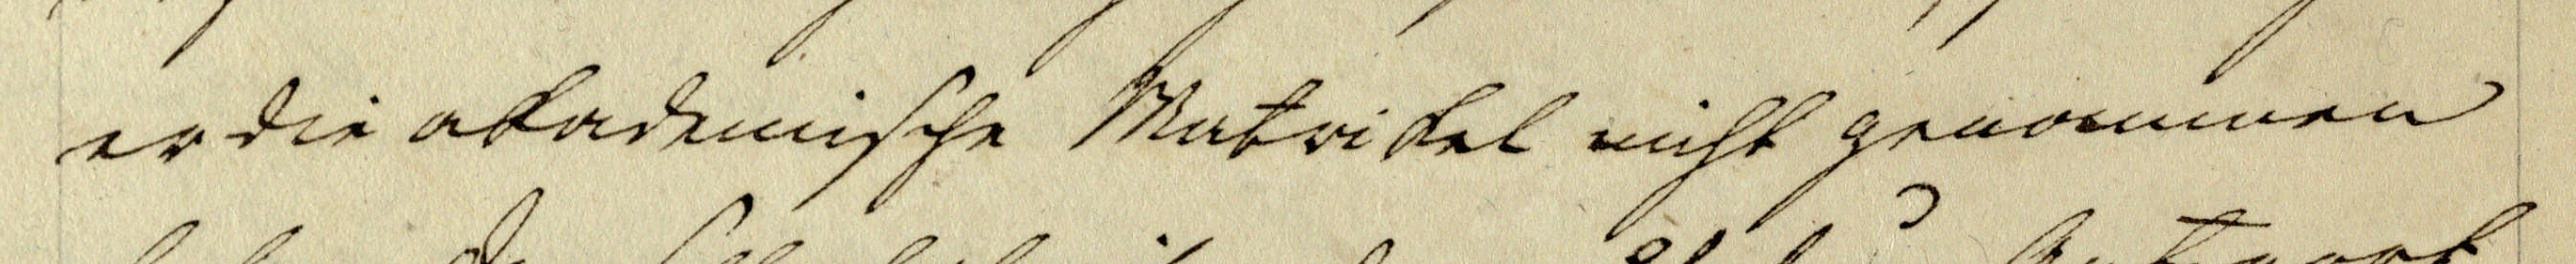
er die akademische Matrikel nicht genommen
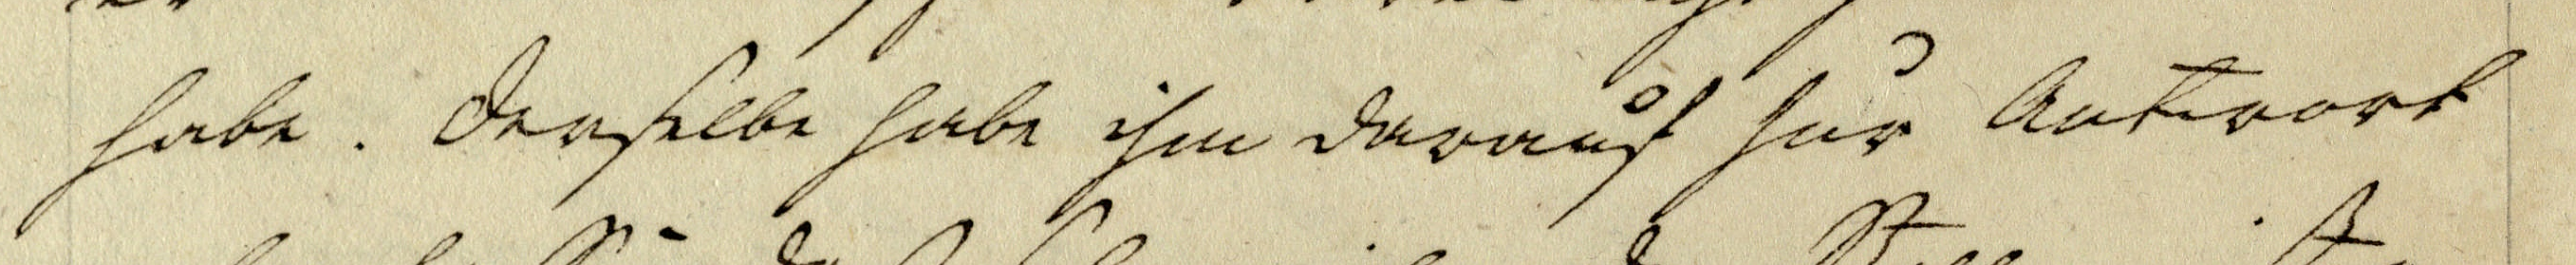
habe. Derselbe habe ihm darauf zur Antwort
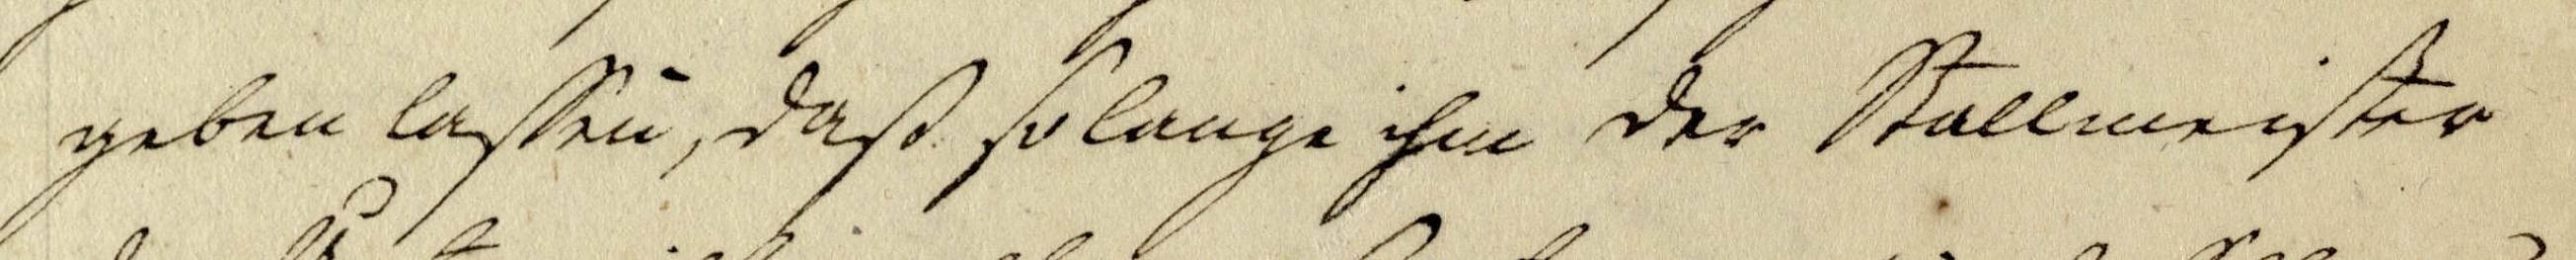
geben lassen, daß solange ihm der Stallmeister
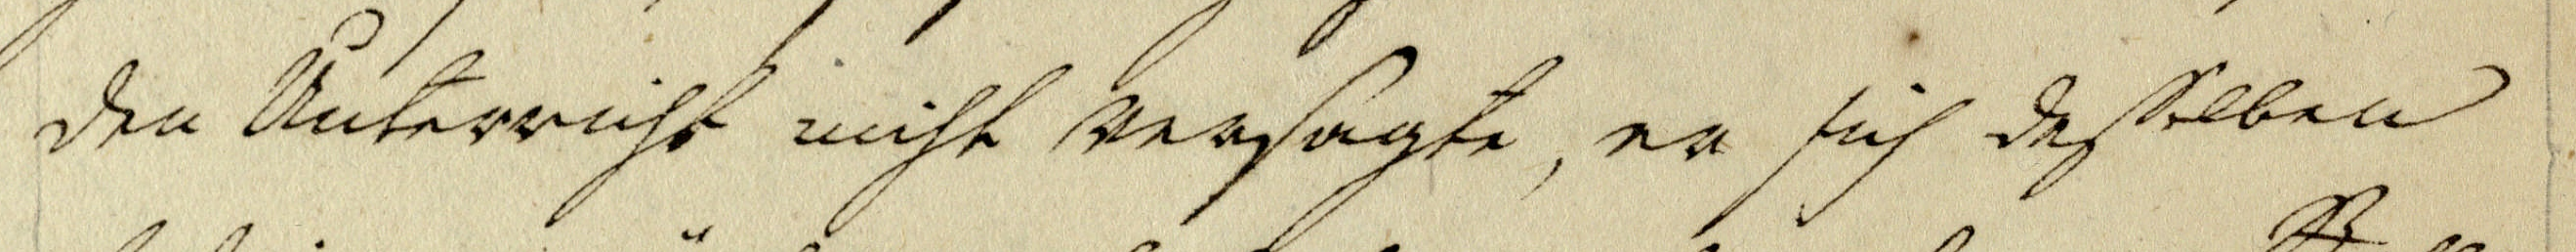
den Unterricht nicht versagte, er sich desselben
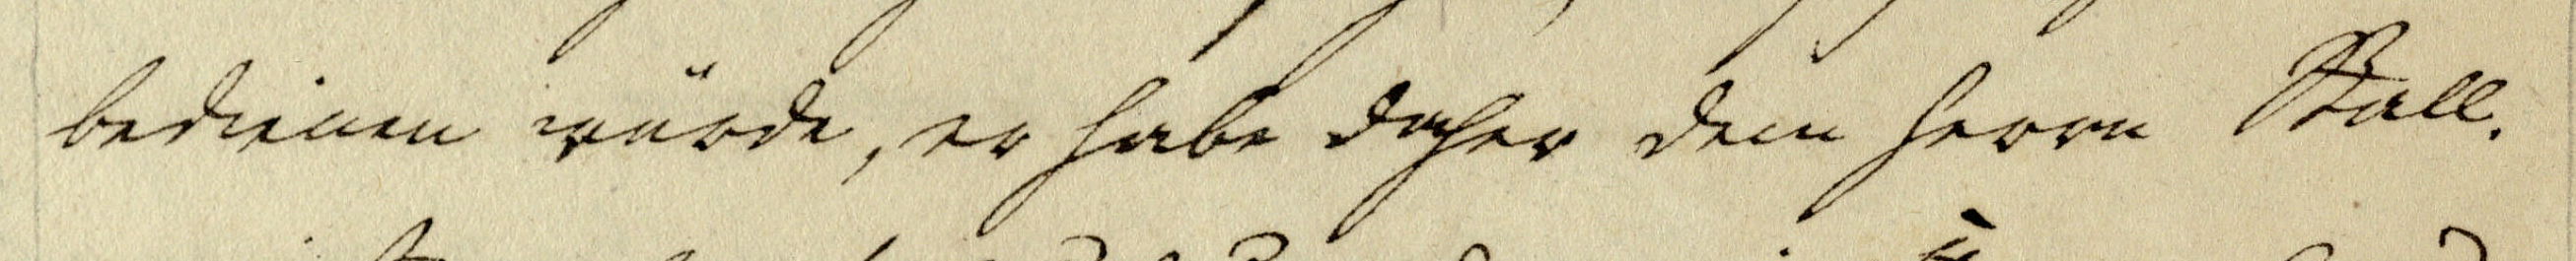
bedienen würde, er habe daher dem Herrn Stall¬
